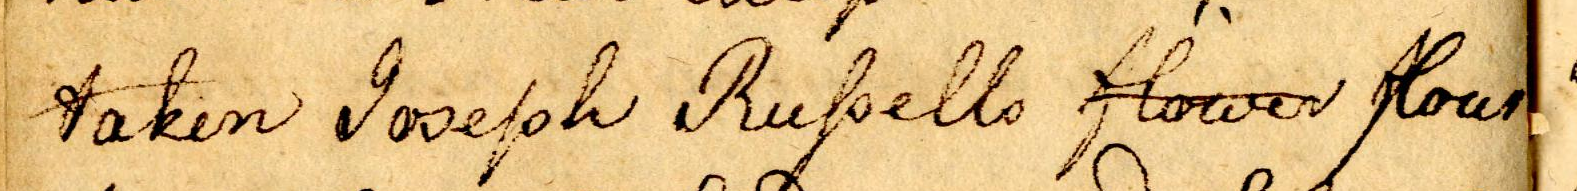taken Joseph Russells [flower] flour
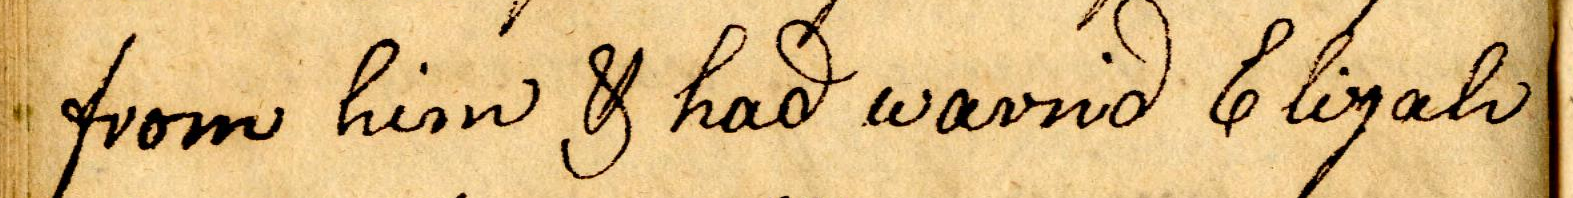from him & had warn'd Elijah
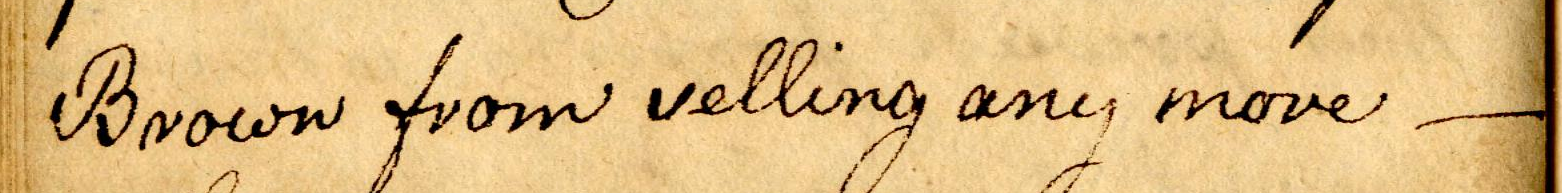Brown from selling any more -
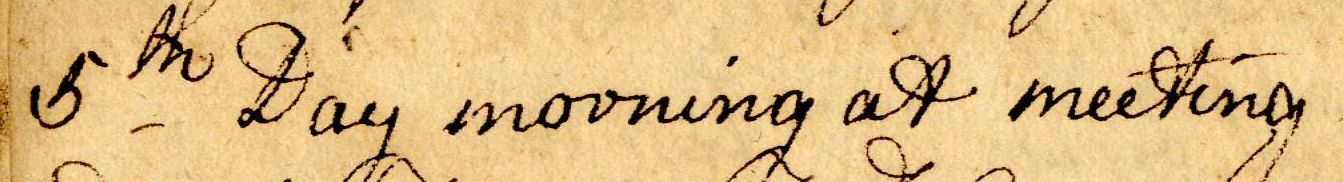5^th Day morning at meeting
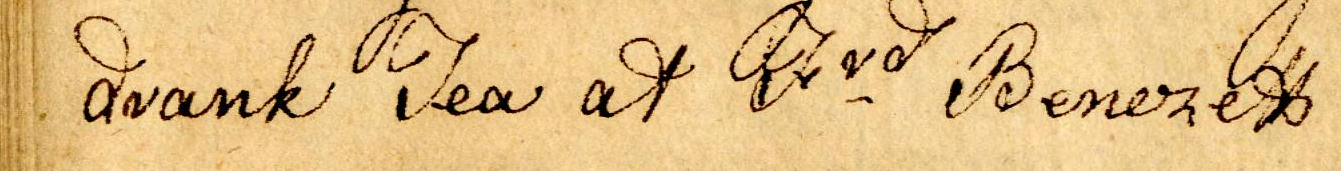drank Tea at F^rd Benezetts
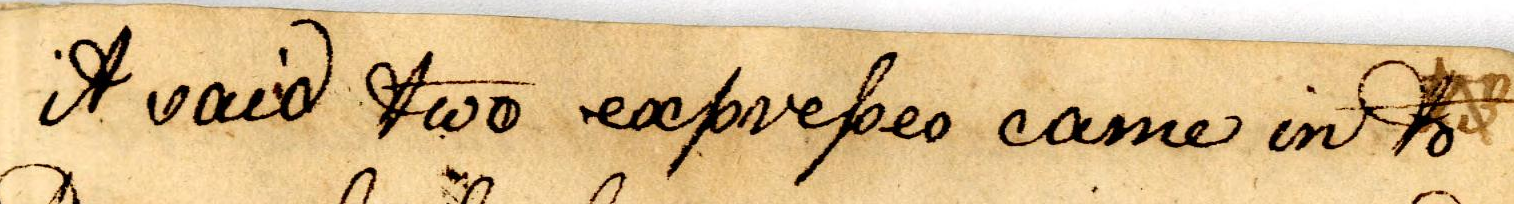it said two expresses came in to 3
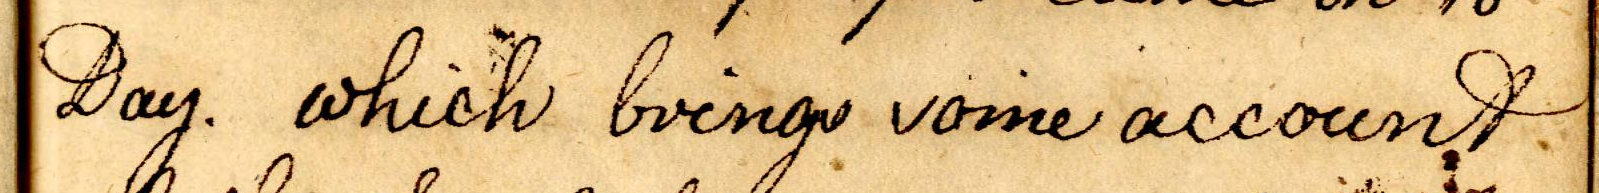Day. which being some account
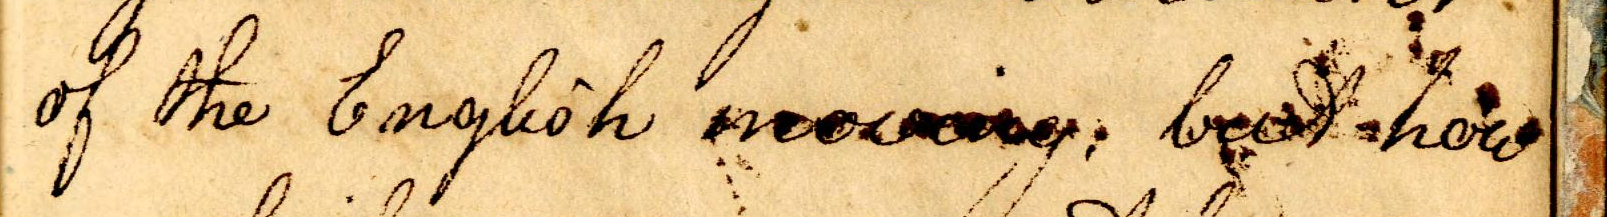of the English [meeting]; but how
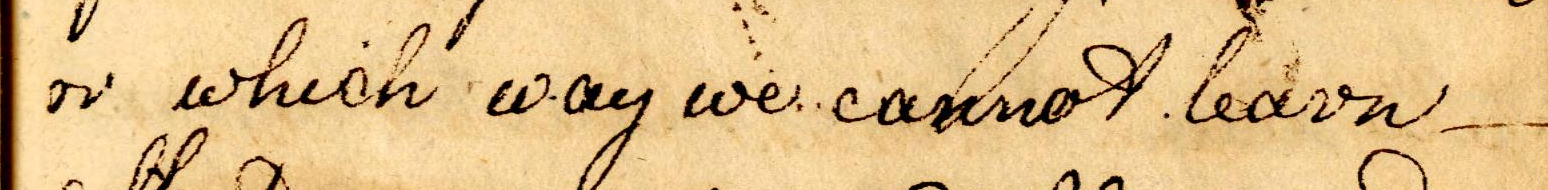or which way we cannot learn-
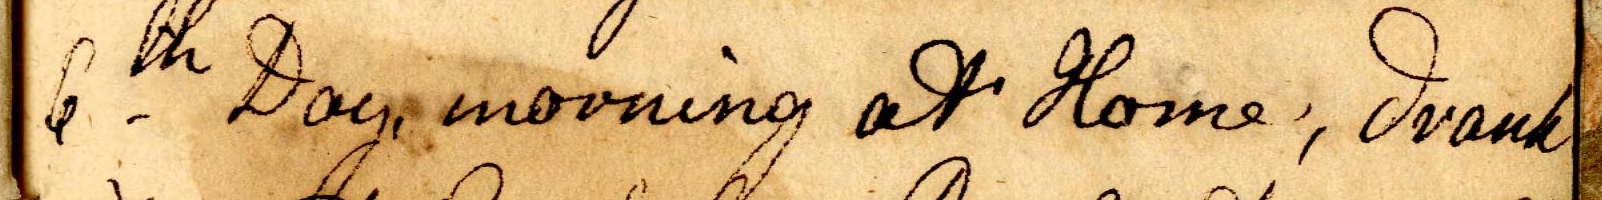6^th Day, morning at Home, drank
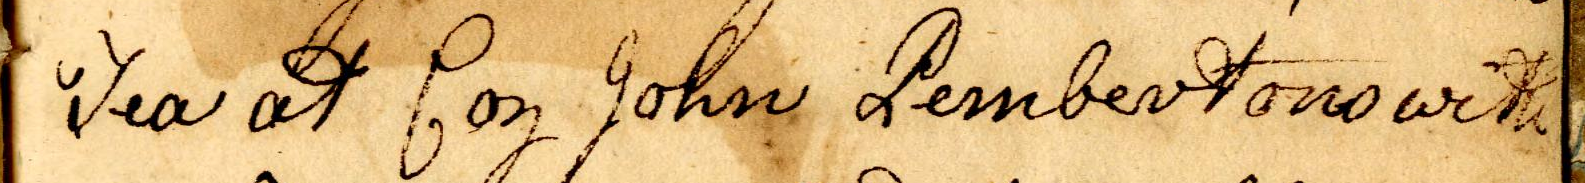Tea at Coz John Pembertons with
